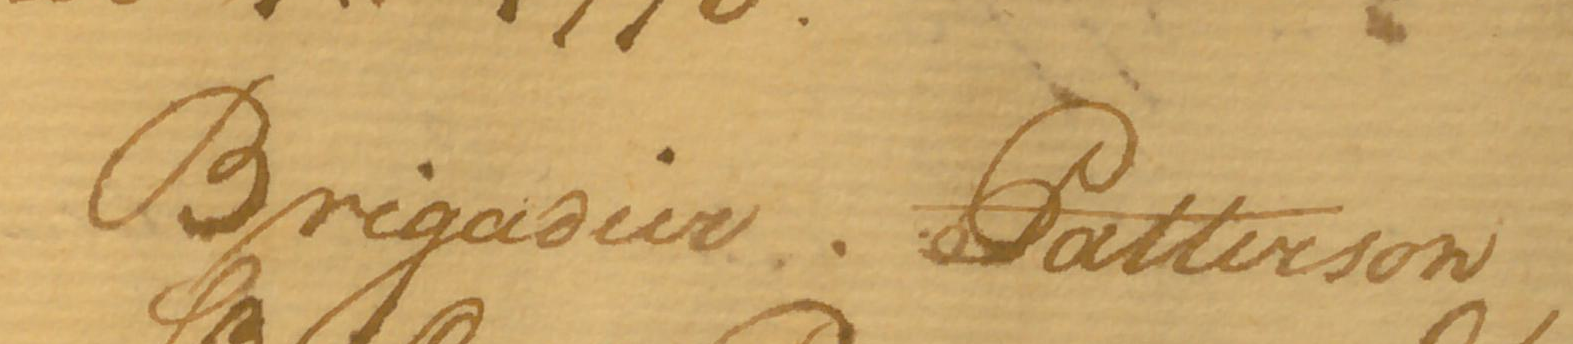Brigadier. Patterson
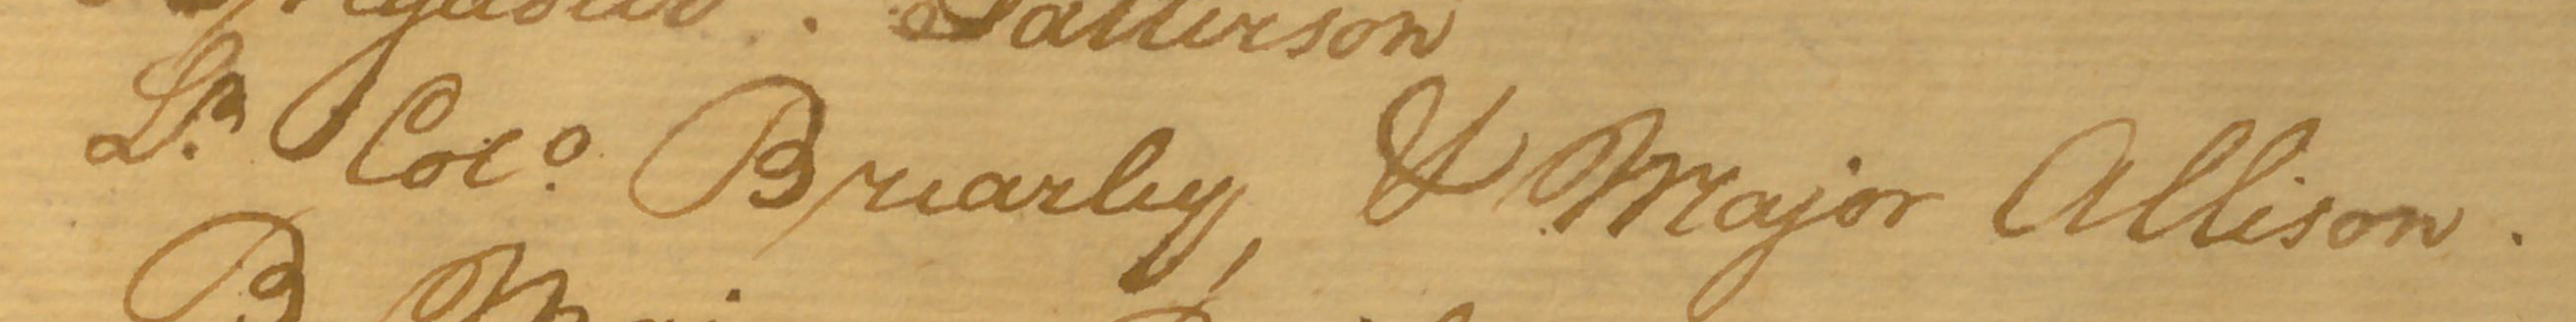L^t. Col^o. Briarley & Major Allison.
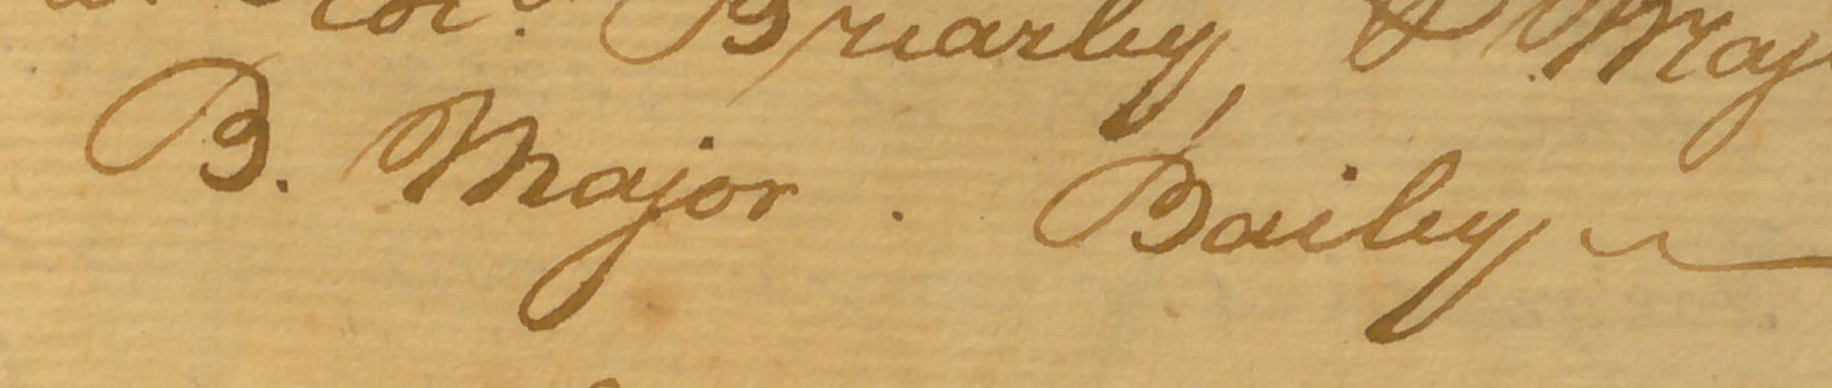B. Major. Bailey-
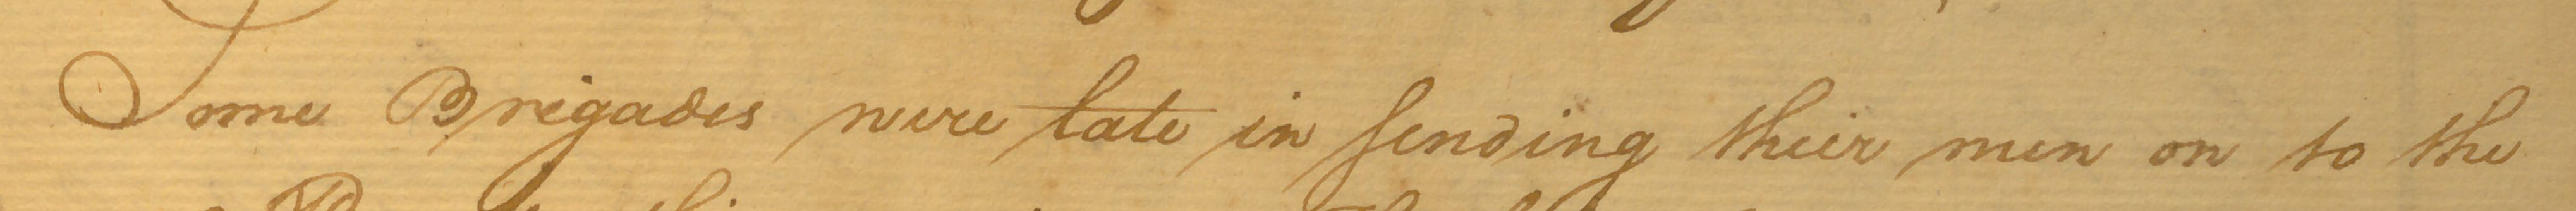Some Brigades were late in sending their men on to the
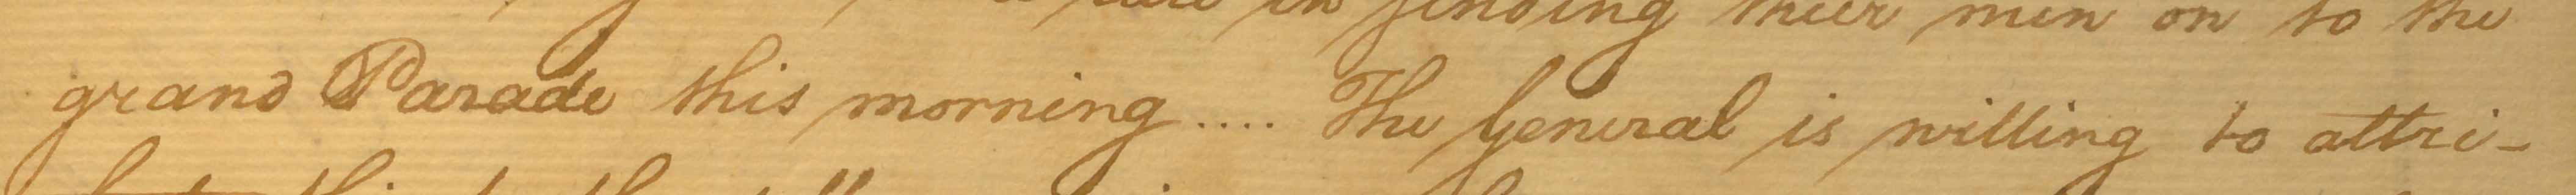grand Parade this morning.... The General is willing to attri-
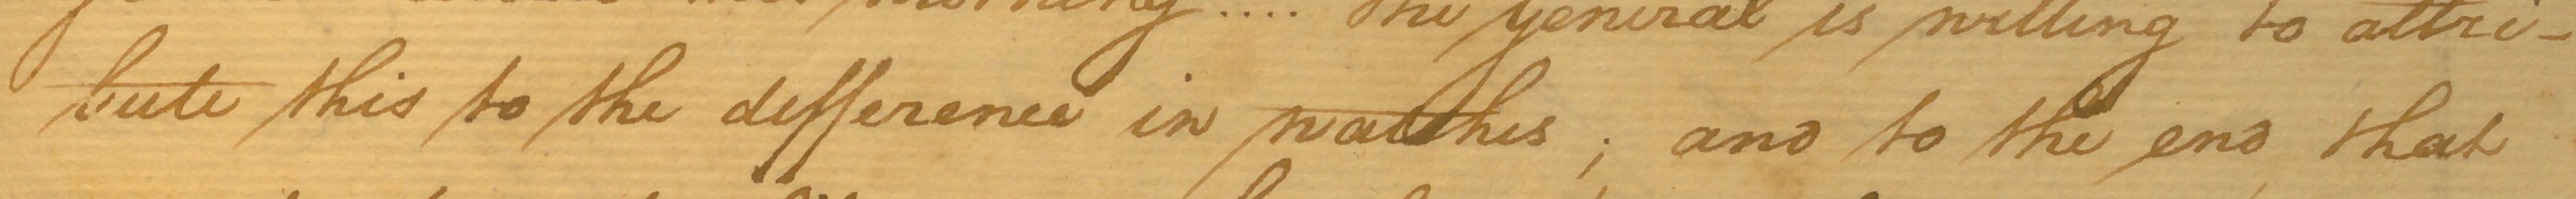bute this to the defference in watches; and to the end that
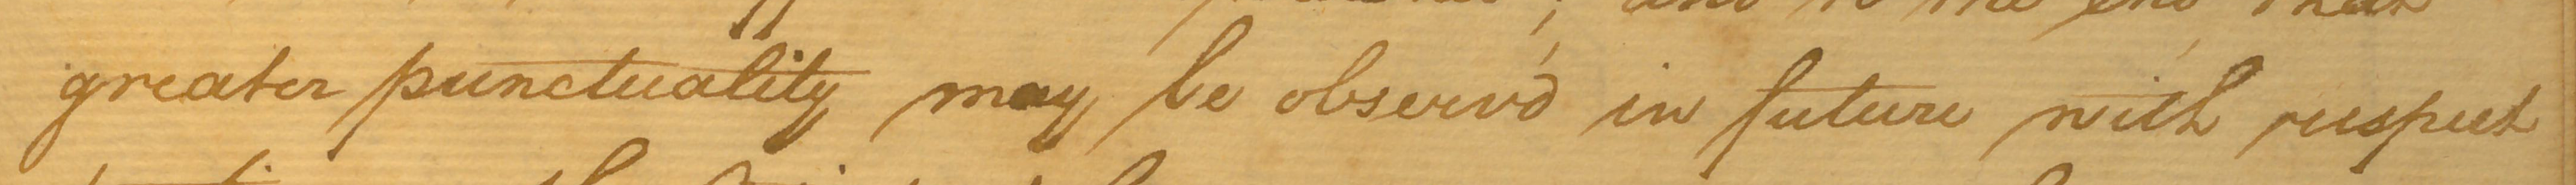greater punctuality may be observ'd in future with respect
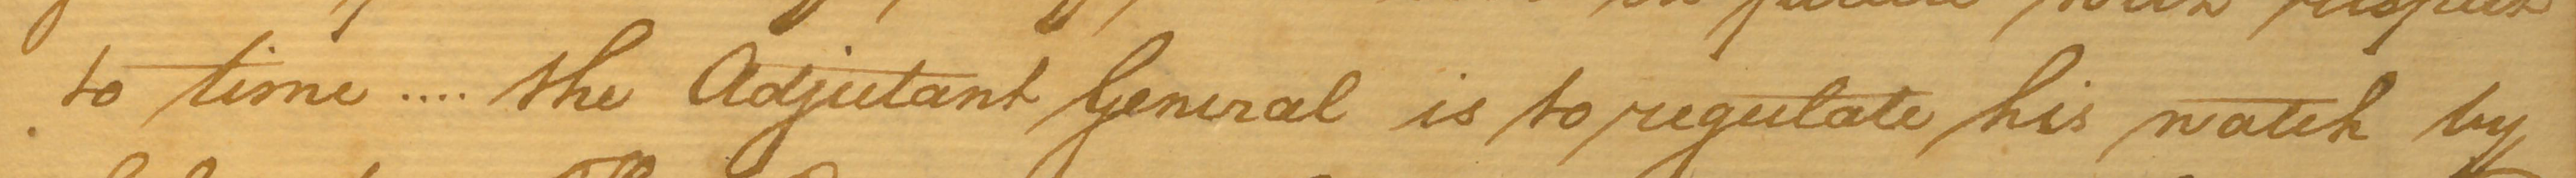to time.... the Adjutant General is to regulate his watch by
